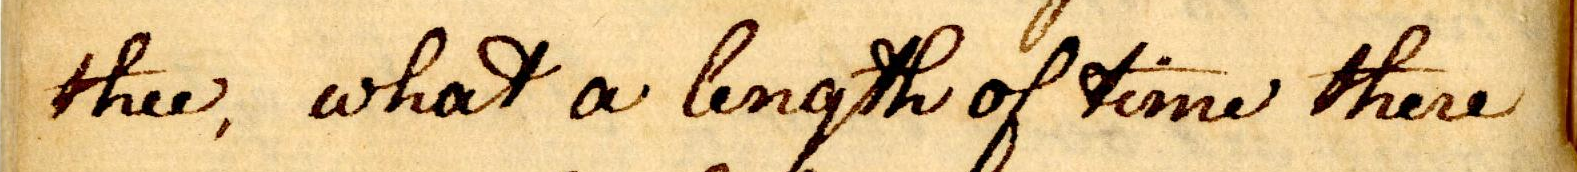thee, what a length of time there
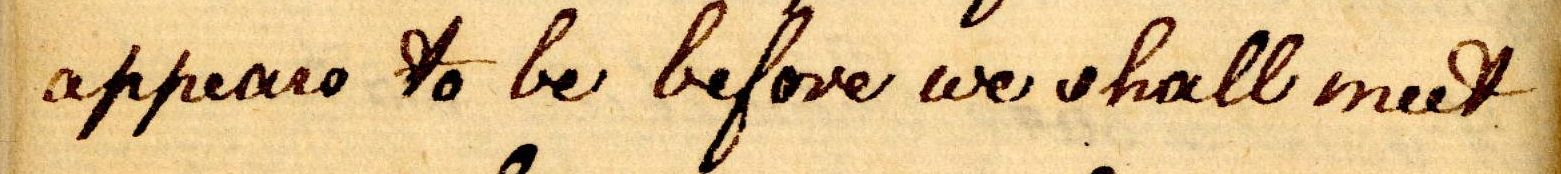appears to be before we shall meet
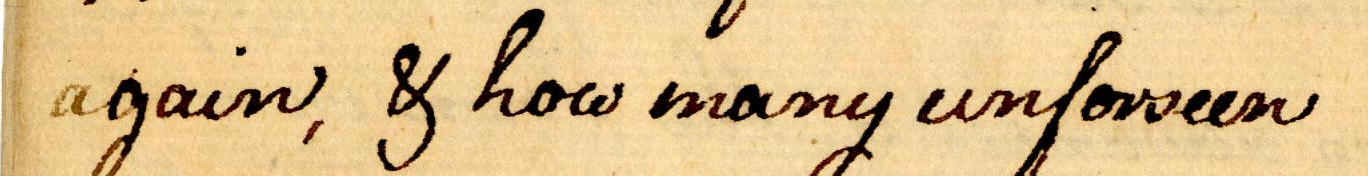again, & how many unforseen
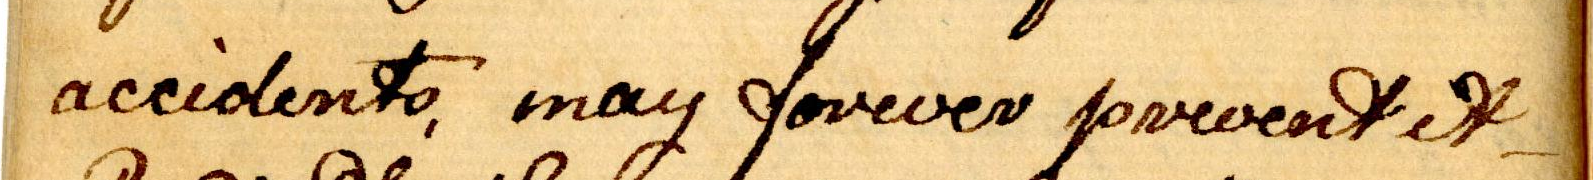accidents, may forever prevent it-
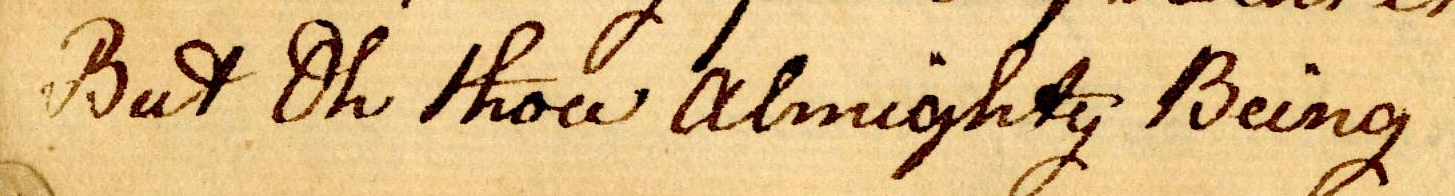But Oh thou Almighty Being
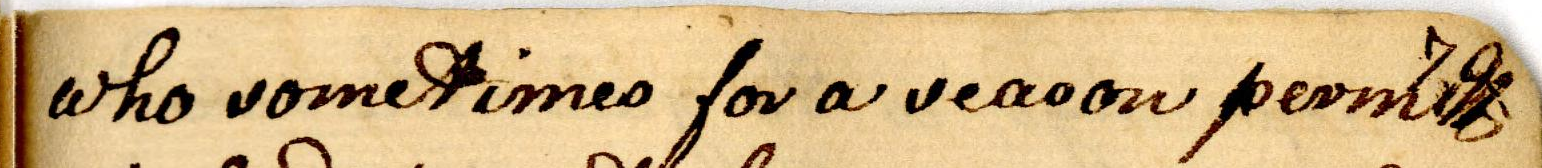who sometimes for a season permits
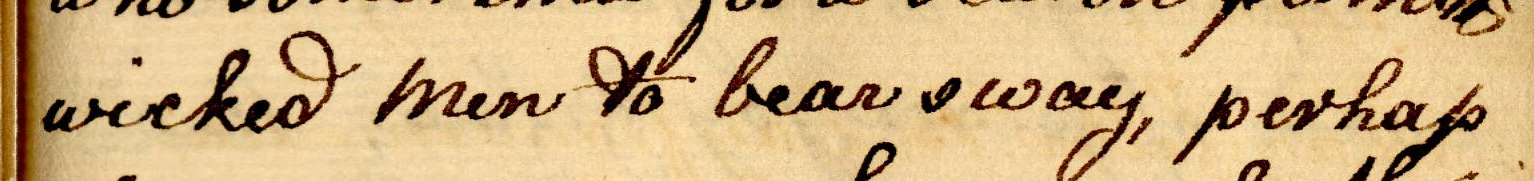wicked Men to bear sway, perhap
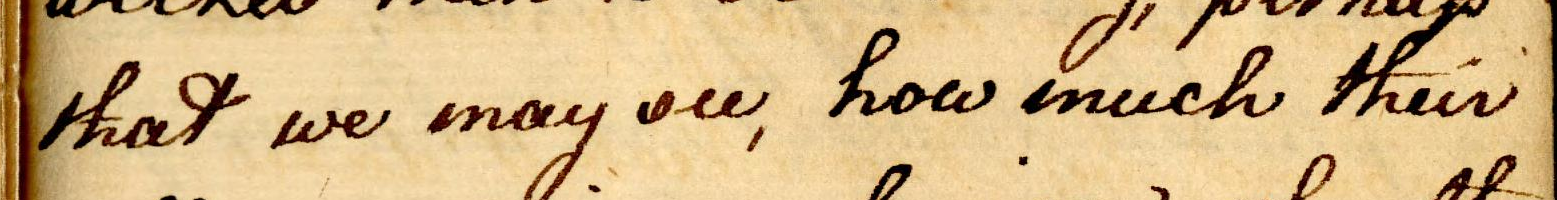that we may see, how much their
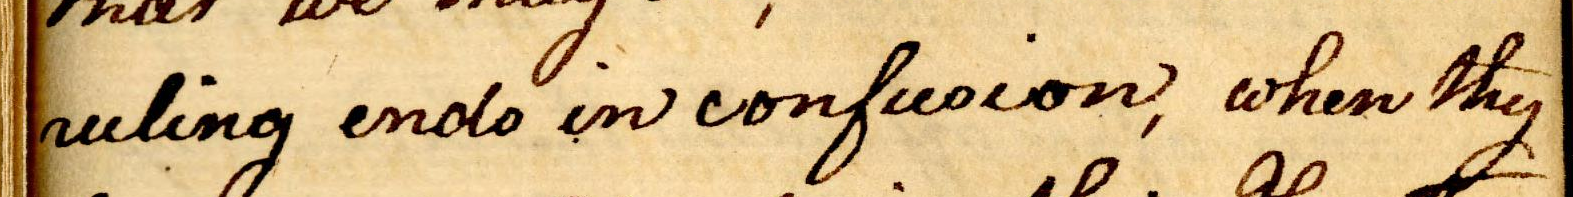ruling ends in confusion, when thy
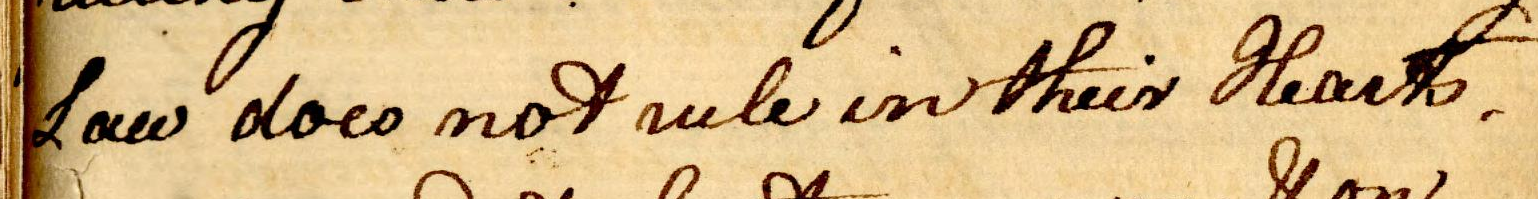Law does not rule in their Hearts.
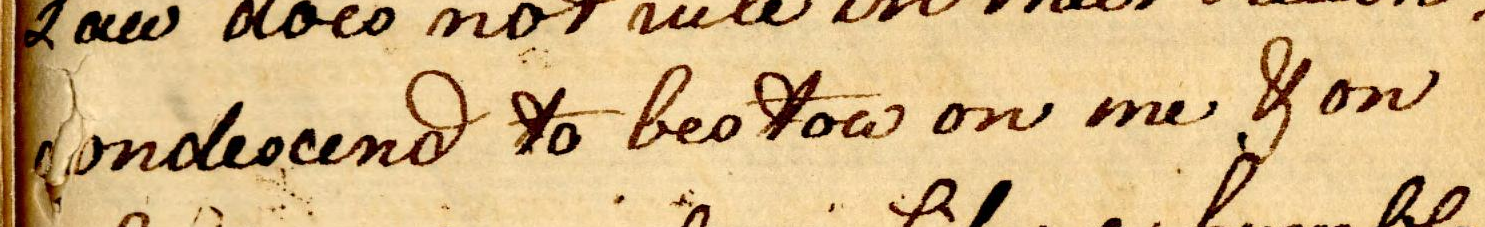condescend to bestow on me & on
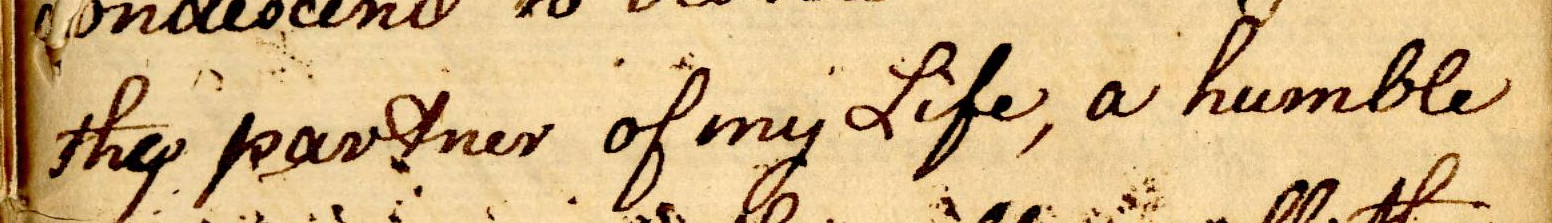thy partner of my Life, a humble
